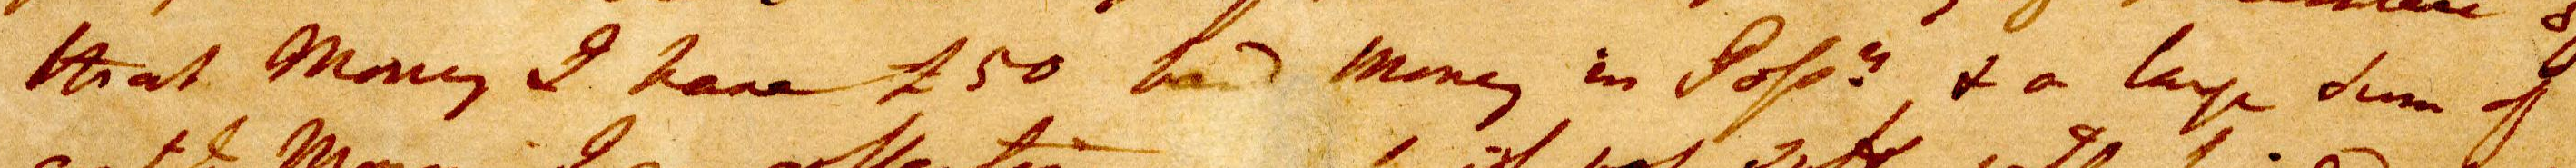that Money I have £50 had Money in Poss^n, & a large Sum of
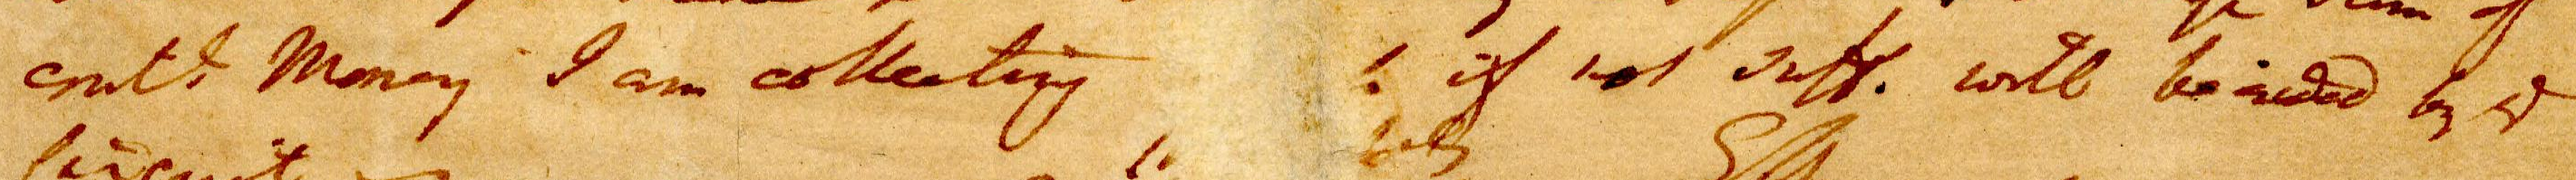cont^l. Money I am collecting if not suff. will be aided by y^e
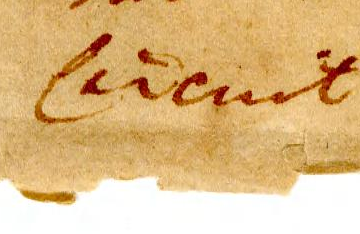Circuit.
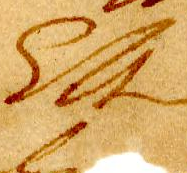EB
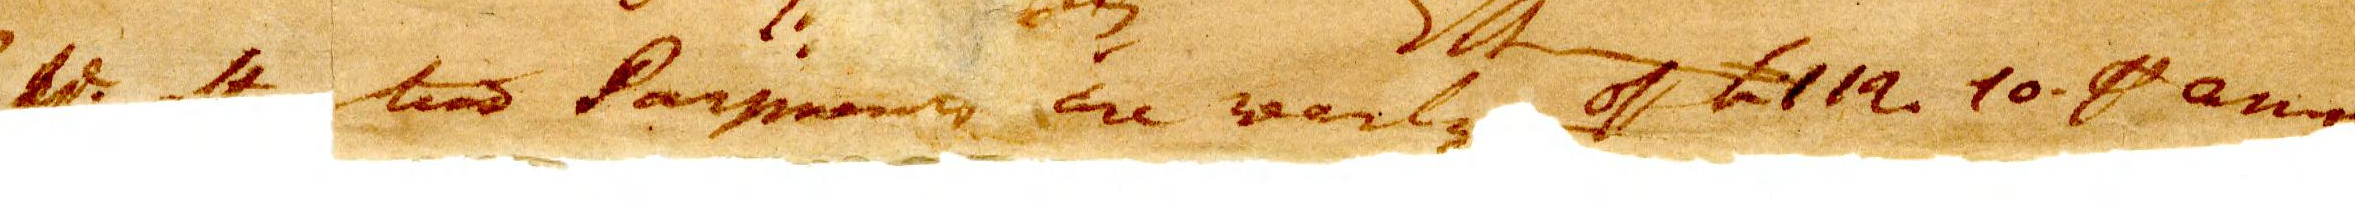We [____] two Par[___]s are yearly of £119.10 per an-
